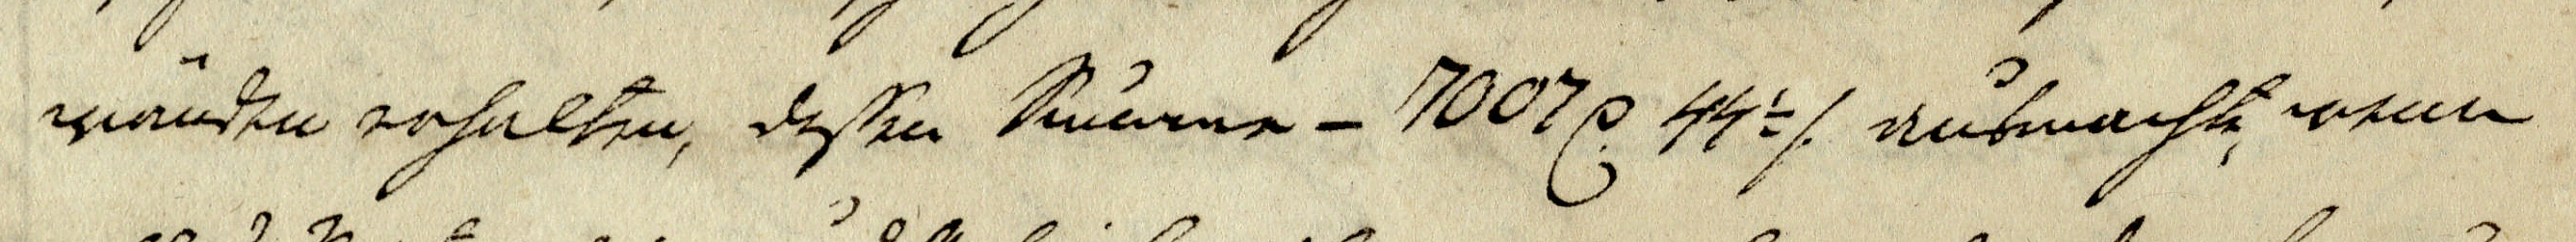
wänden erhalten, dessen Summe - 7007 l 44½ s. ausmachte, wenn
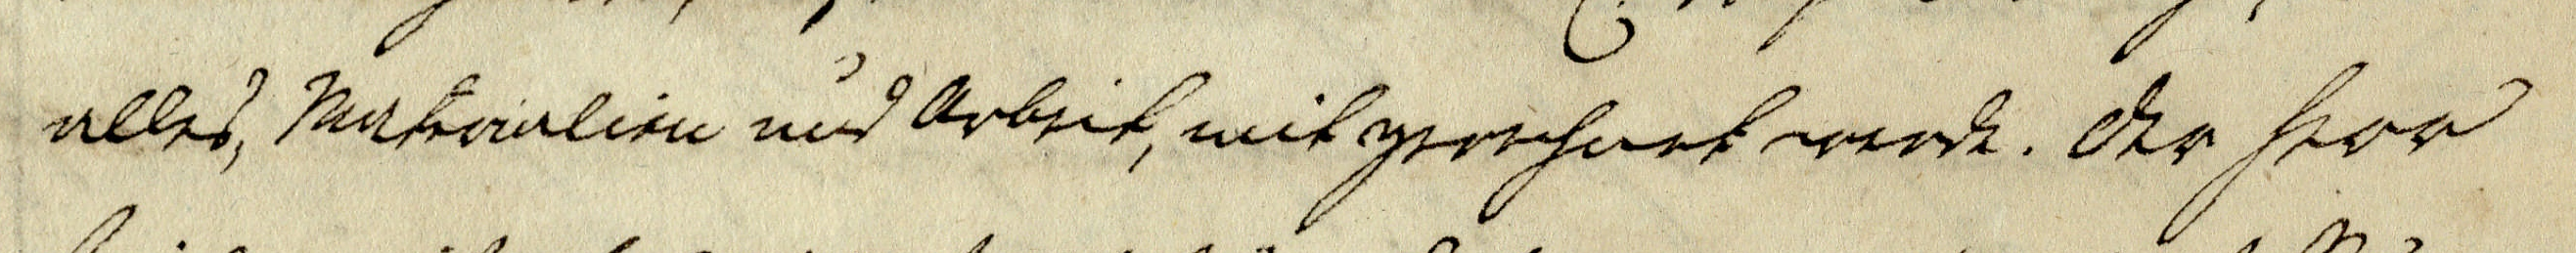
alles, Materialien und Arbeit, mitgerechnet werde. Der Herr
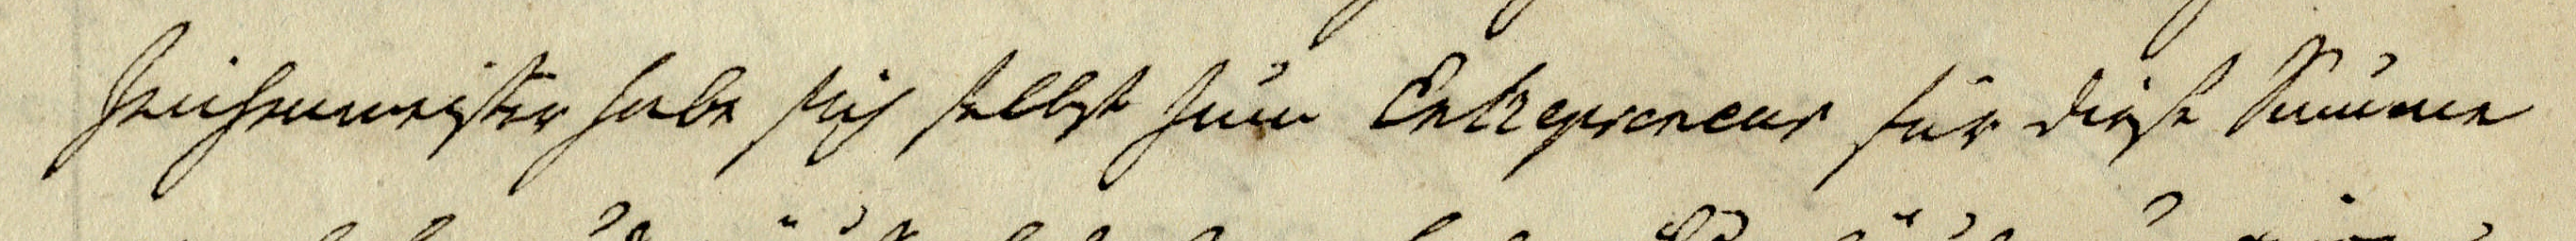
Zeichenmeister habe sich selbst zum Entrepreneur für diese Summe
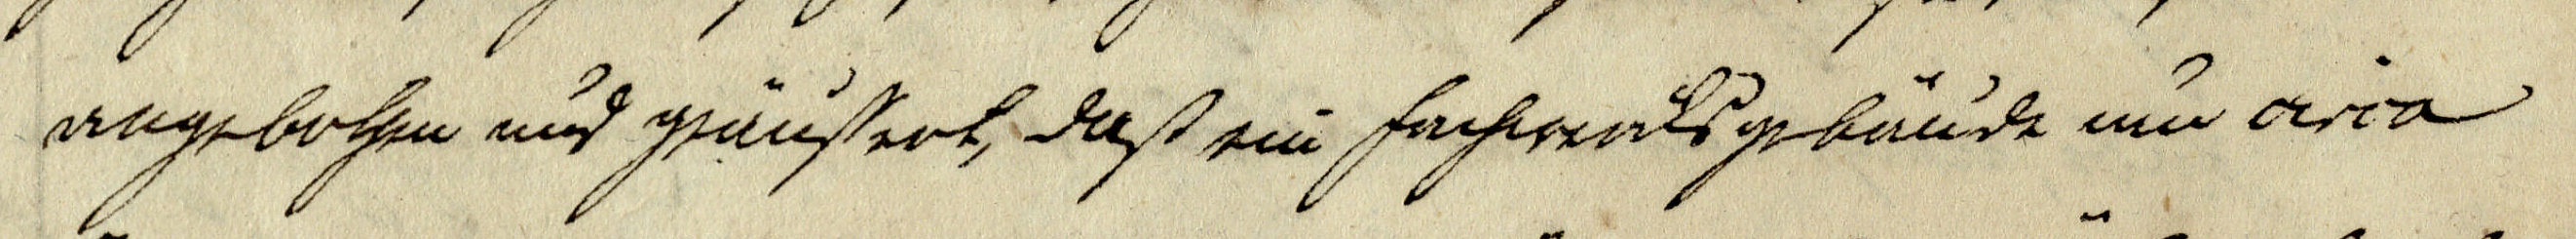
angebothen und geäussert, daß ein Fachwercksgebäude um circa
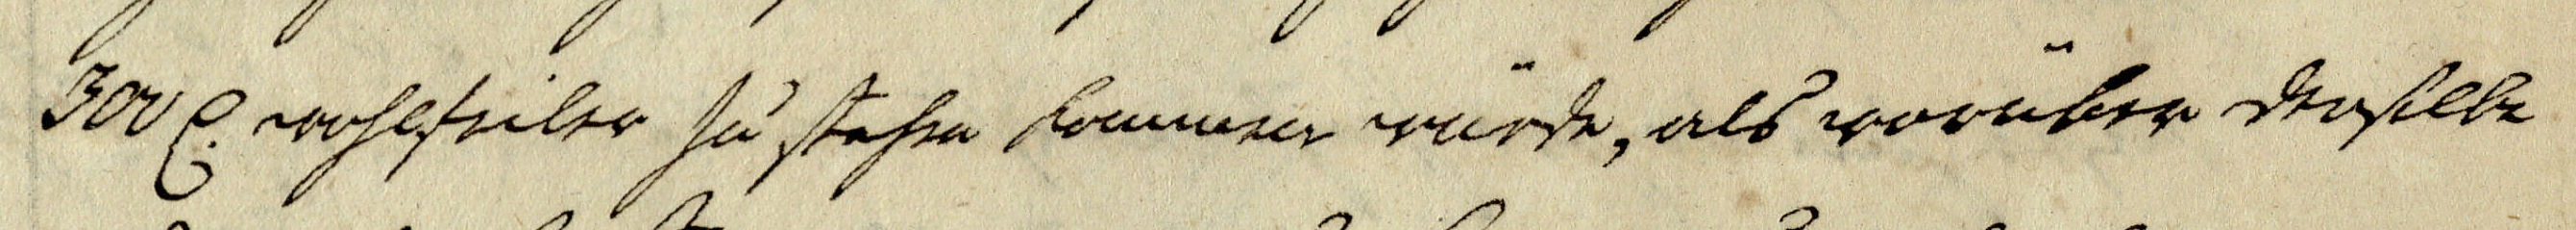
300 l. wohlfeiler zu stehen kommen würde, als worüber derselbe
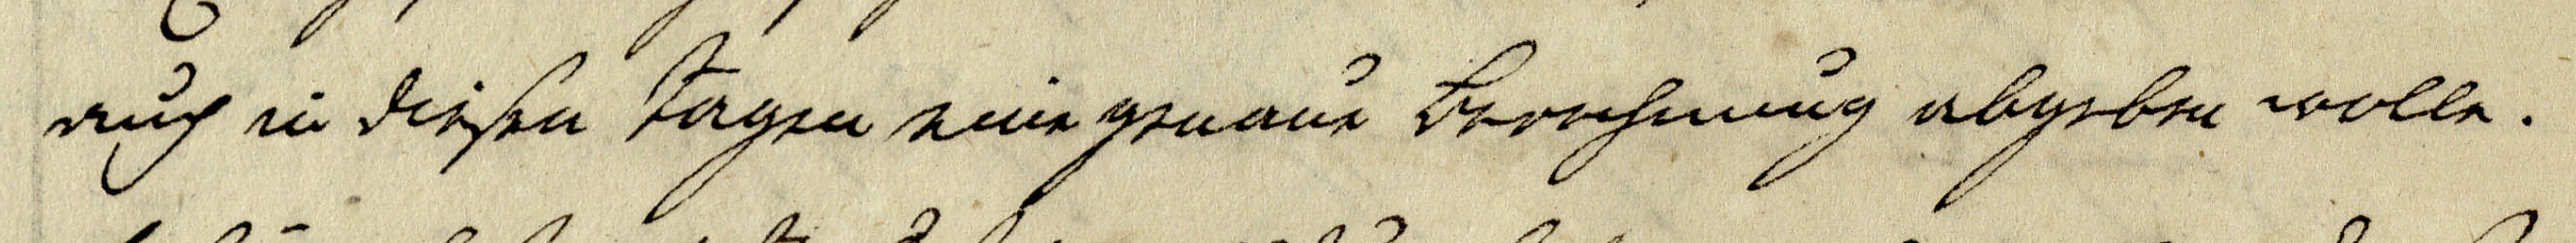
auch in diesen Tagen eine genaue Berechnung abgeben wolle.
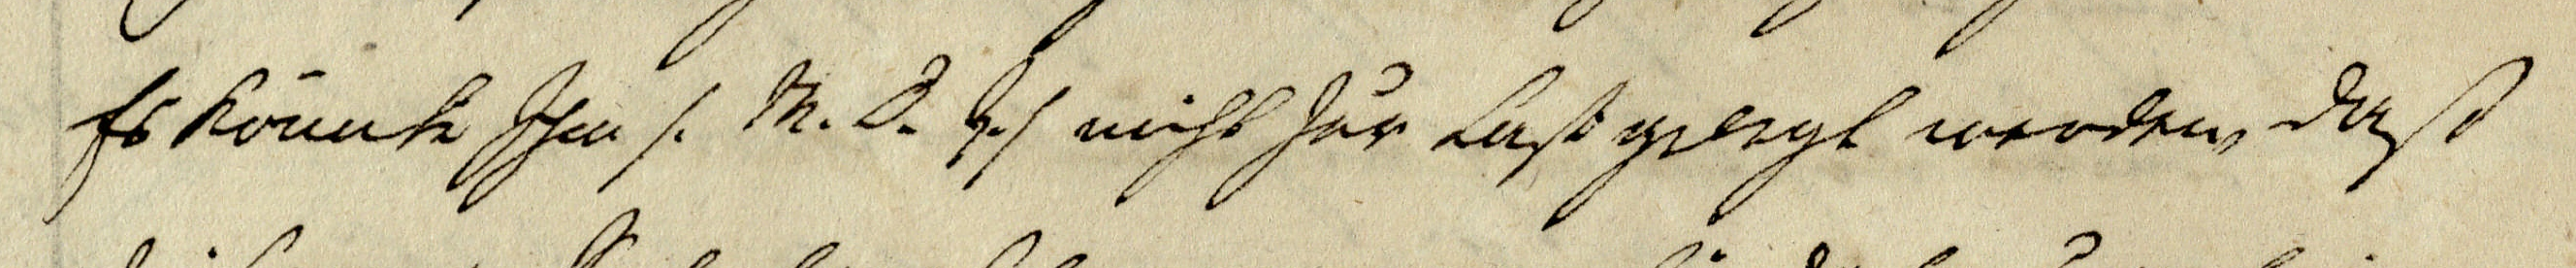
Es könnte Ihm /. M. D. R./ nicht zur Last gelegt werden, daß
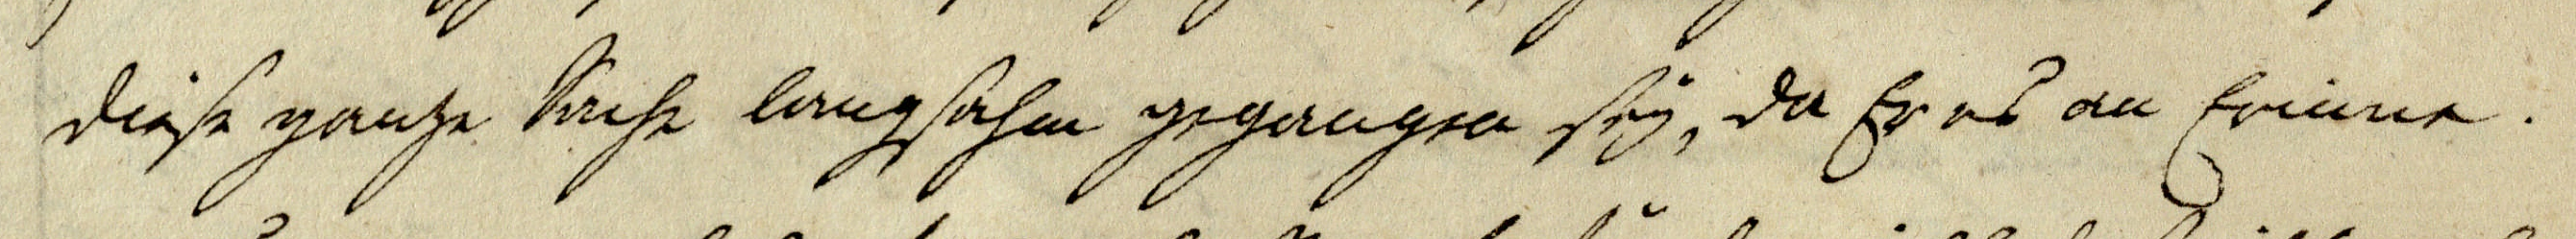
diese ganze Sache langsahm gegangen seÿ, da Er es an Erinne¬
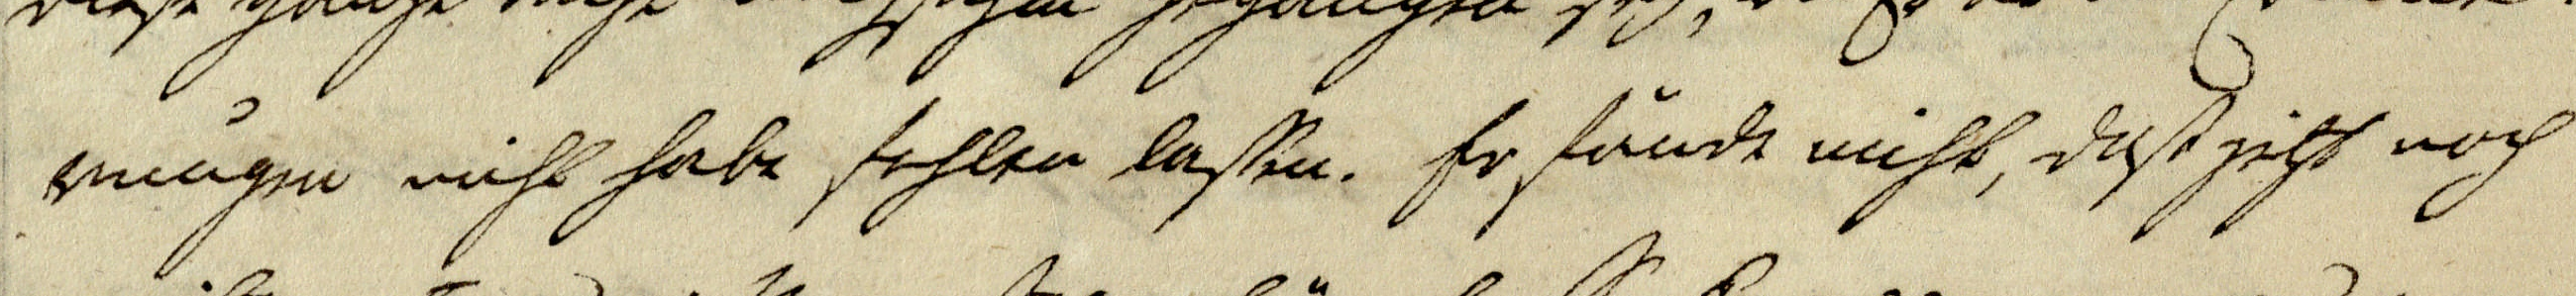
rungen nicht habe fehlen lassen. Er fände nicht, daß jetzt noch
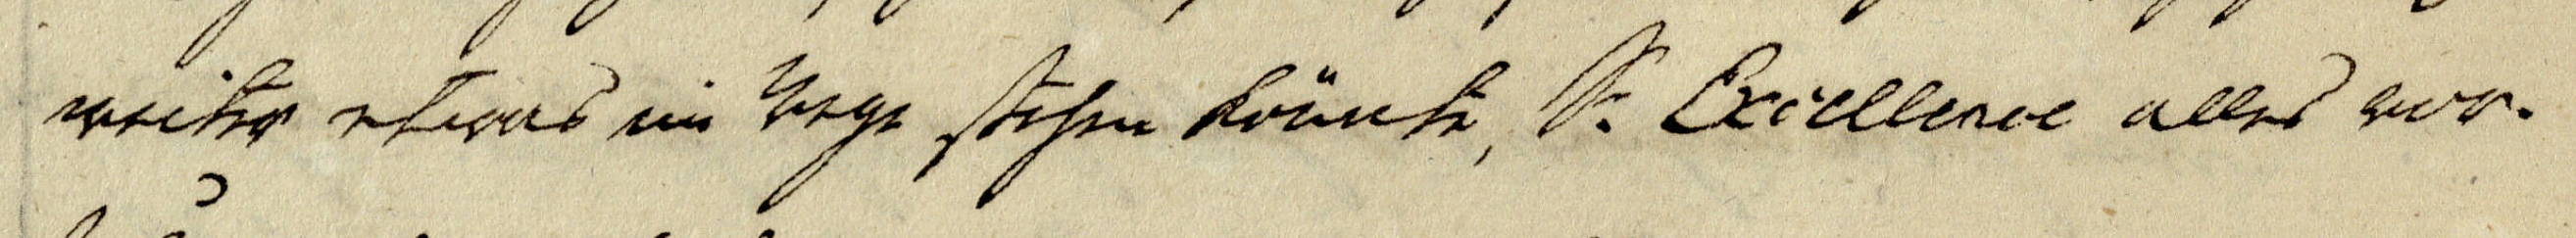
weiter etwas im Wege stehen könnte, Sr. Excellence alles vor¬
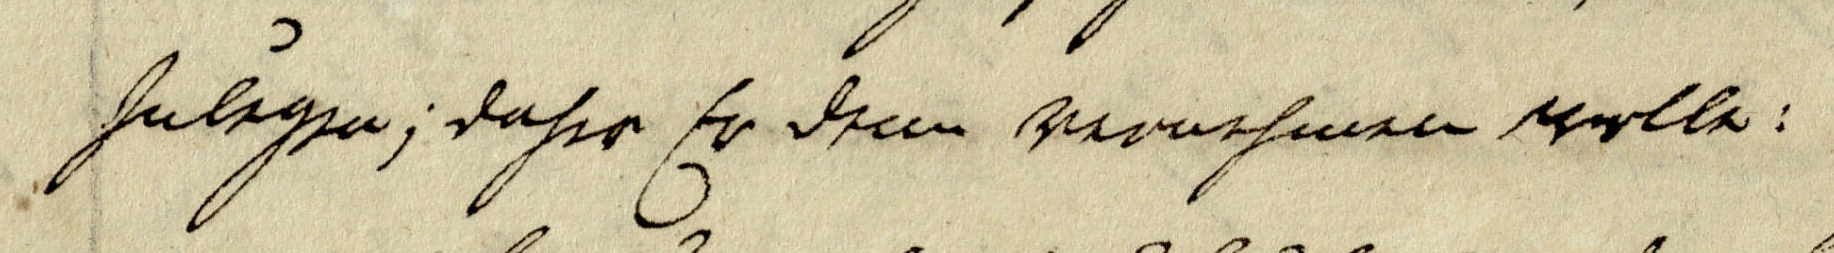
zulegen; daher Er denn vernehmen wolle:
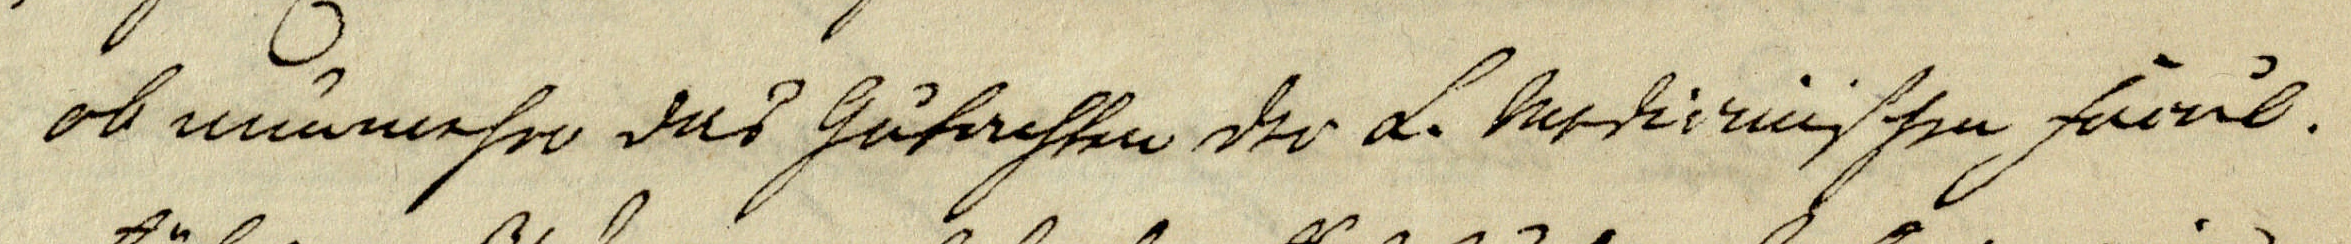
ob nunmehro das Gutachten der L. Medicinischen Facul¬
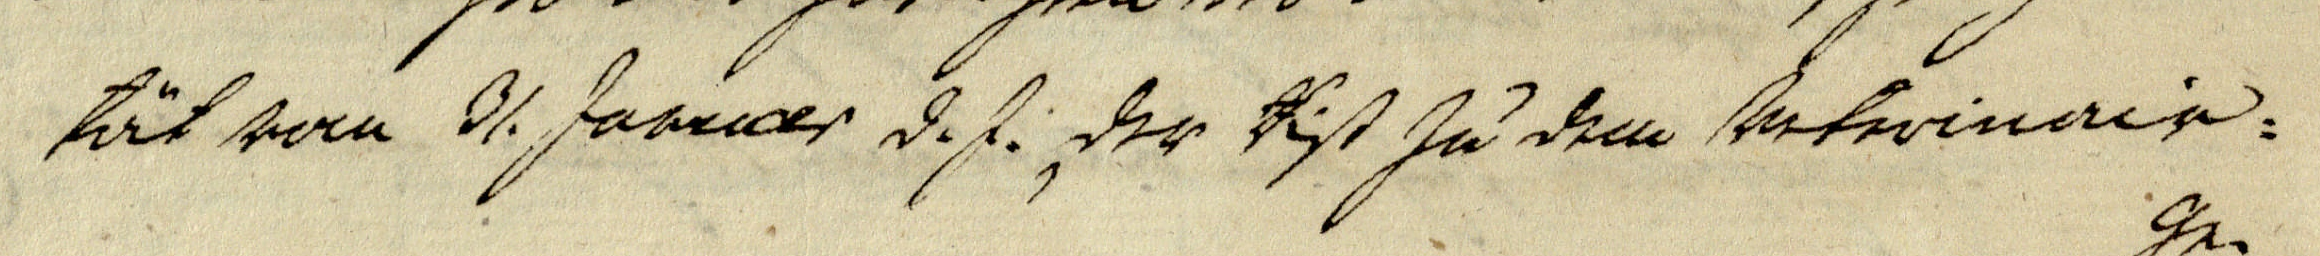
tät vom 31. Januar d. J., der Riß zu dem Veterinair¬
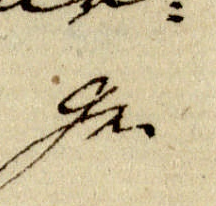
ge.
